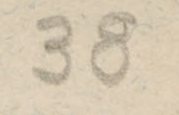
28.
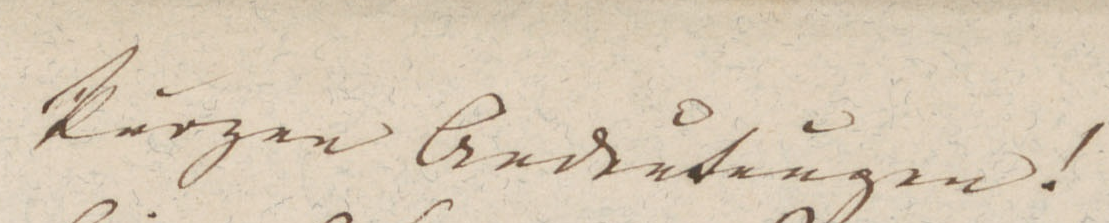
kurzen Andeutungen!
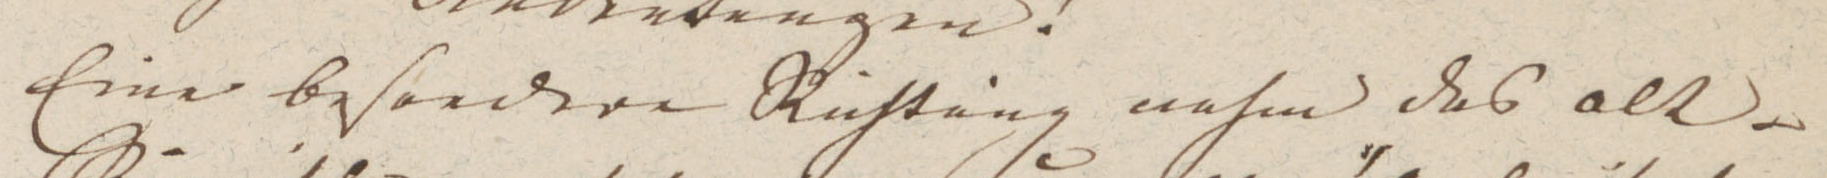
Eine besondere Richtung nahm das alt-
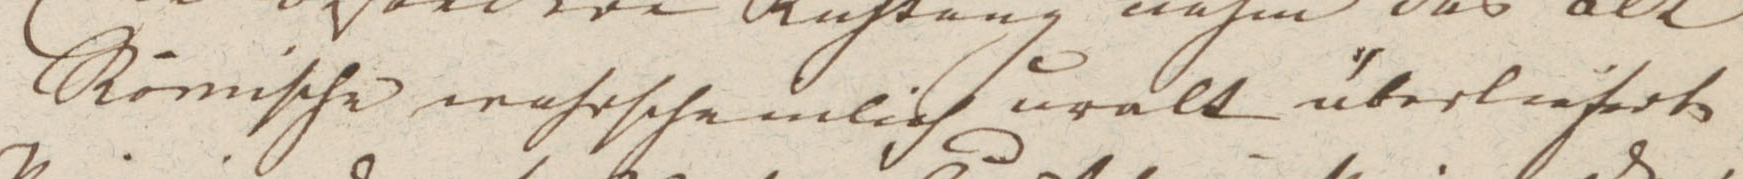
Römische wahrscheinlich uralt überlieferte
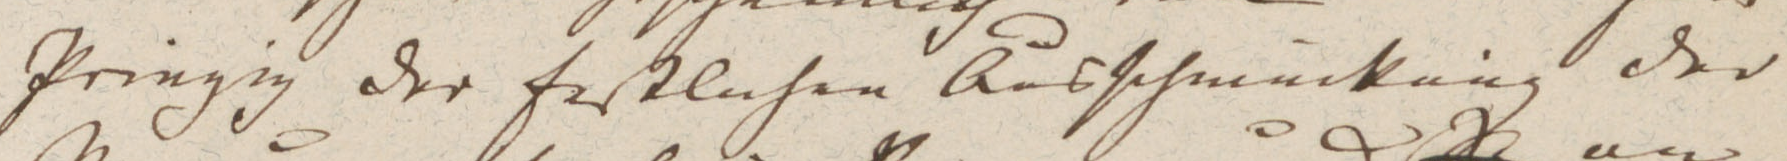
Prinzip der festlichen Ausschmückung der
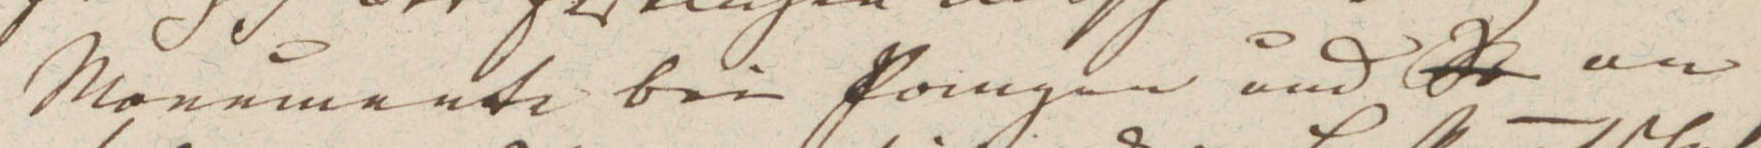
Monumente bei Pompen und S an
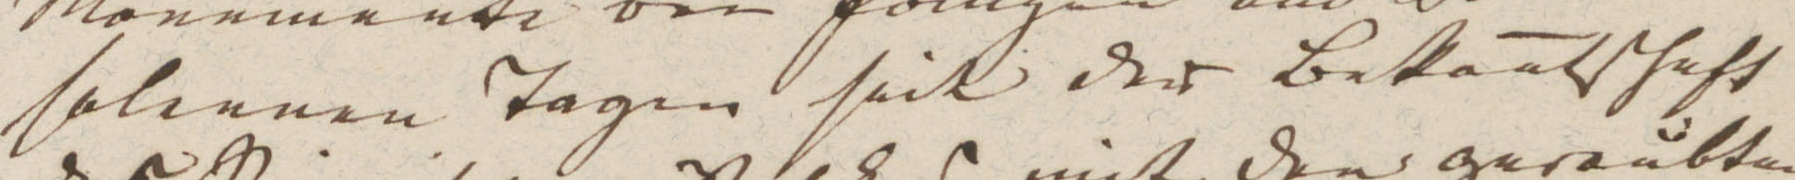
solennen Tagen seit der Bekanntschaft
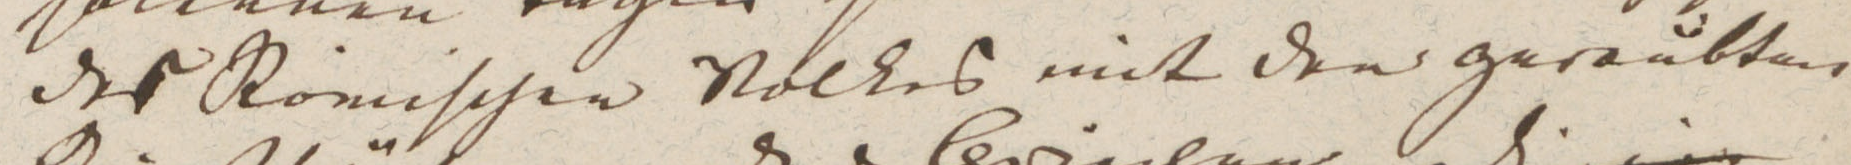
des Römischen Volkes mit den geraubten
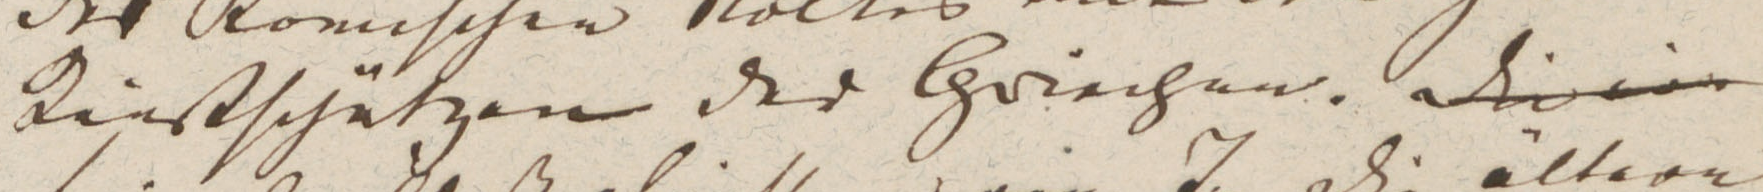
Kunstschätzen der Griechen. Die ur-
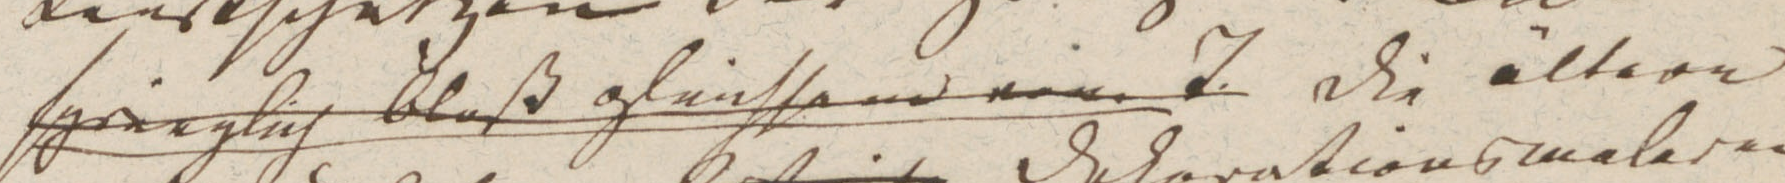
sprünglich bloss gleichsam T Die ältere
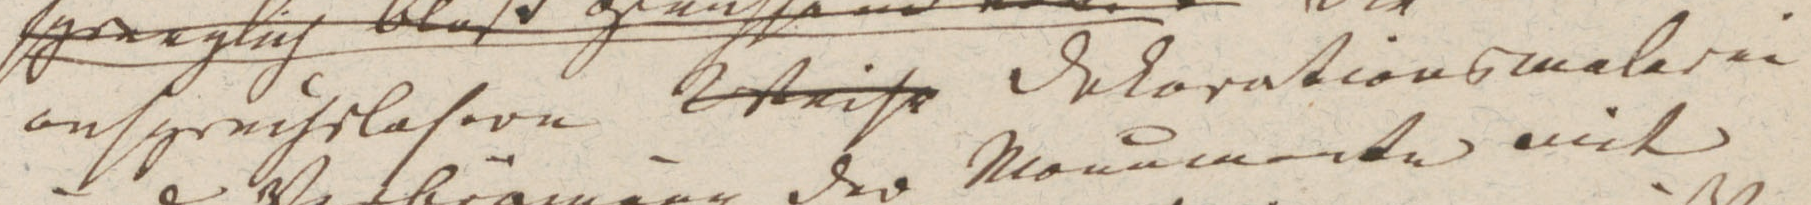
anspruchslosere Weise Dekorationsmalerei
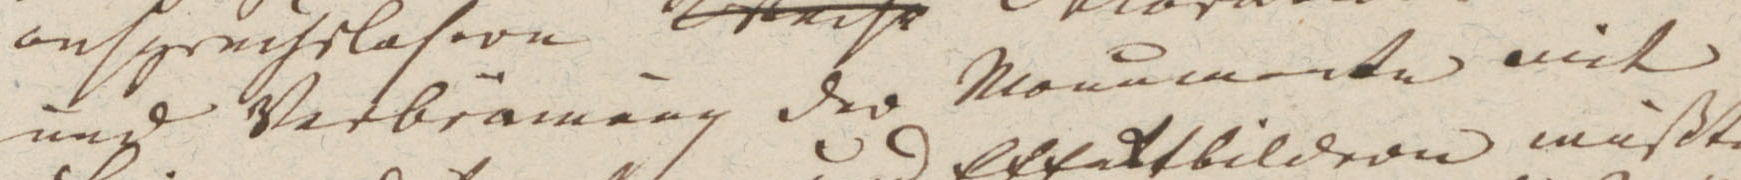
und Verbrämung der Monumente mit
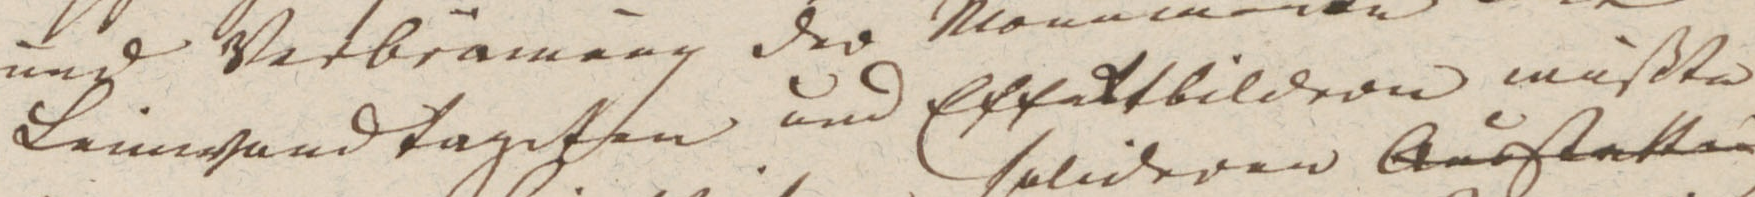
Leinwandtapeten und Effektbildern musste
